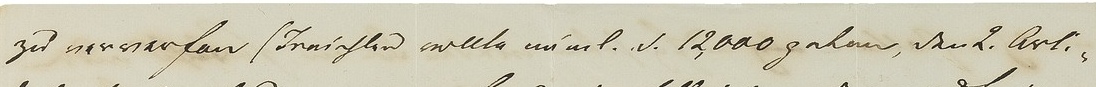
zu verwerfen (Treichler wollte näml. d. 12,000 geben, den 2. Arti-
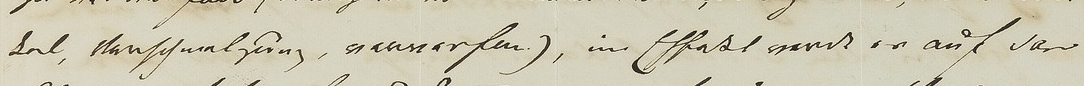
kel, Verschmelzung, verwerfen), im Effekt werde es auf das
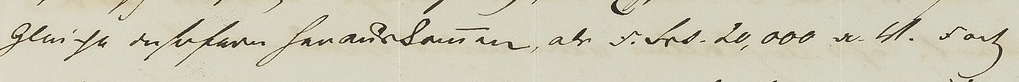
Gleiche insofern hinauskommen, als d. Frk. 20,000 a. W. doch
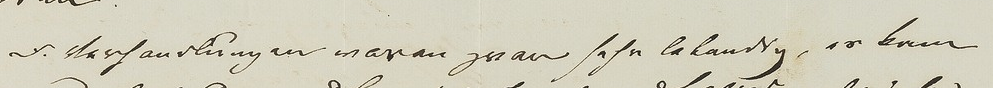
D. Verhandlungen waren zwar sehr lebendig, es kam
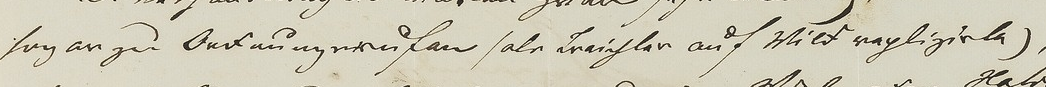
sogar zu Ordnungsrufen (als Treichler auf Wild replizirte),
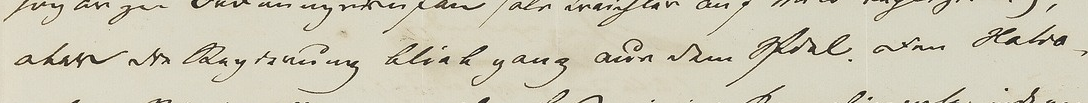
aber die Regierung blieb ganz aus dem Spiel. Den Natio-
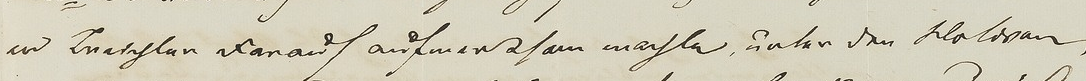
er Treichler darauf aufmerksam machte, unter den Motiven,
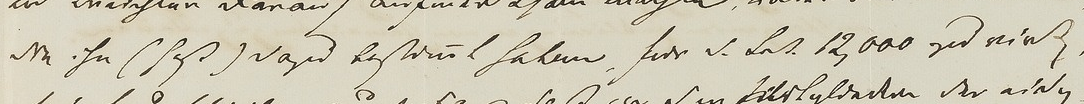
die ihn (Heß) dazu bestimmt haben, für d. Frk. 12,000 zu wirken,
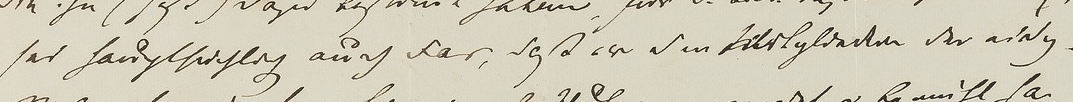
sei hauptsächlich auch das, daß er den Mitgliedern der eidg.
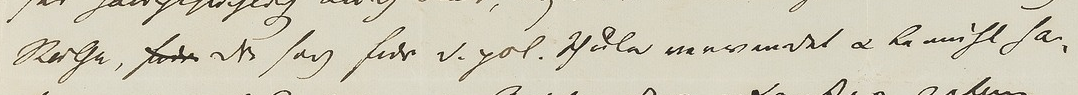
Räthe, für die sich für d. pol. Schule verwendet & bemüht ha-
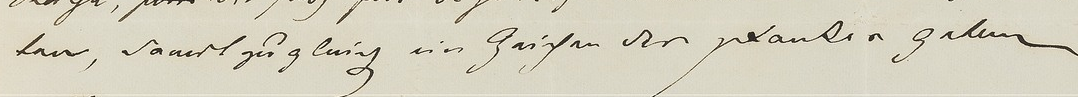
ben, damit zugleich ein Zeichen des Dankes geben
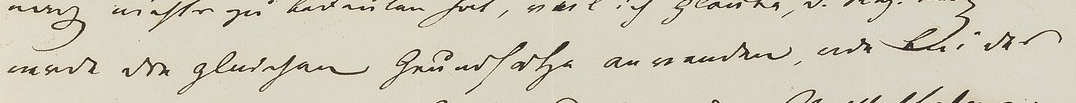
werde die gleichen Grundsätze anwenden, wie bei der
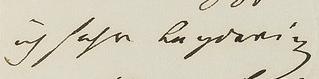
ich sehr begierig.
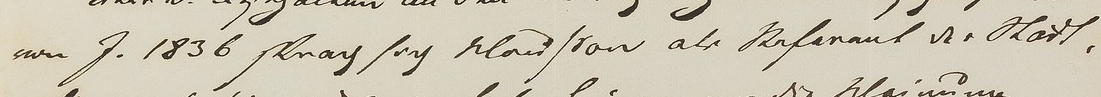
vom J. 1836 sprach sich Mousson als Referent des Stadt-
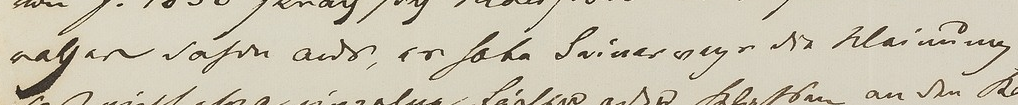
rathes dahin aus, er habe keineswegs die Meinung,
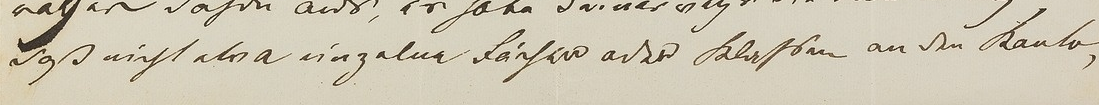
daß nicht etwa einzelne Fächer oder Klassen an den Kanto-
